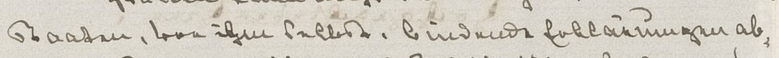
Staaten, vor ihm selbst, bindende Erklärungen ab-
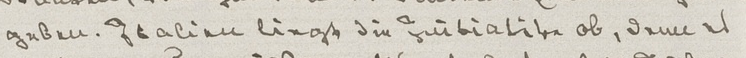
geben. Italien liegt die Initiative ob, denn es
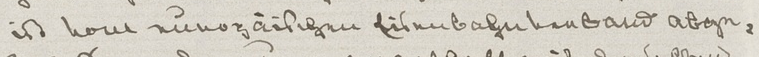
ist vom europäischen Eisenbahnverband abge-
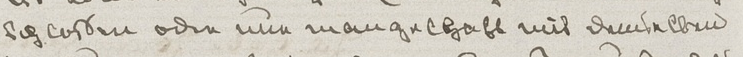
schlossen oder nur mangelhaft mit demselben
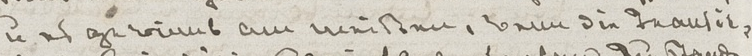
u es gewinnt am meisten, wenn die Transit-
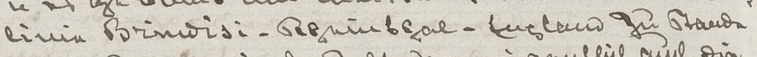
linie Brindisi–Rheinthal–England zu Stande
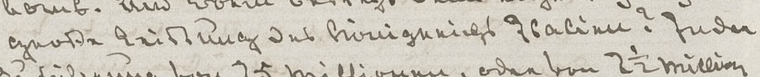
große Leistung des Königreichs Italien? In der
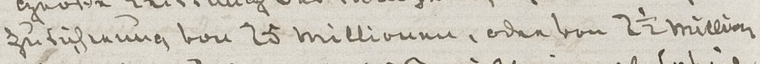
Zusicherung von 25 Millionen, oder von 2½ Millionen
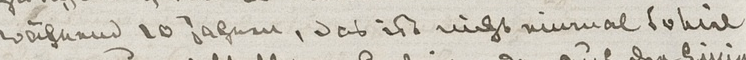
während 20 Jahren, das ist nicht einmal soviel
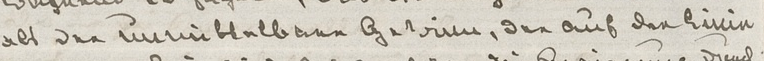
als der unmittelbare Gewinn, der auf der Linie
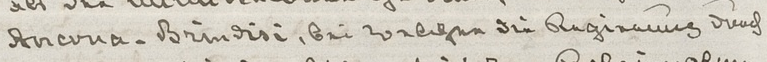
Ancona–Brindisi, bei welcher die Regierung durch
